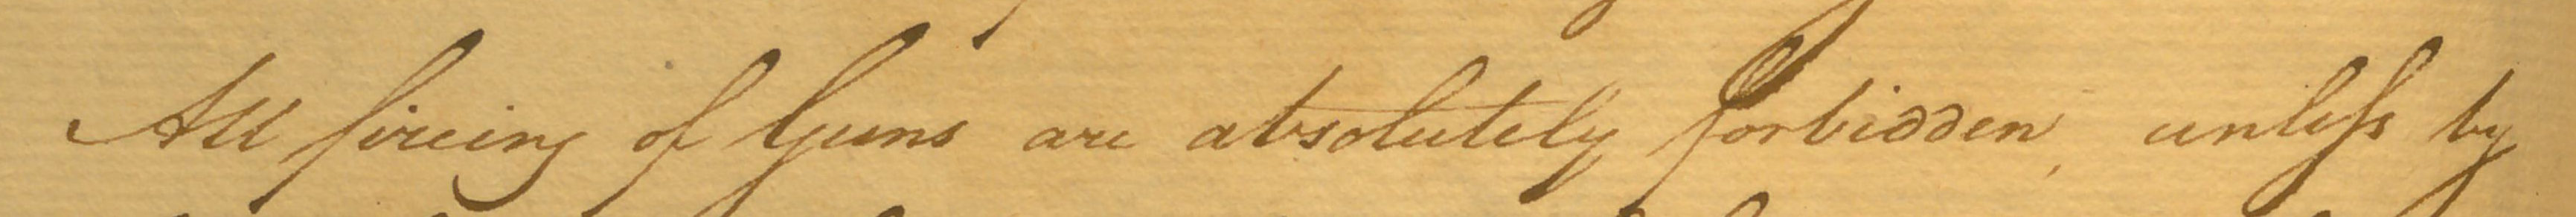All firing of Guns are absolutely forbidden unless by
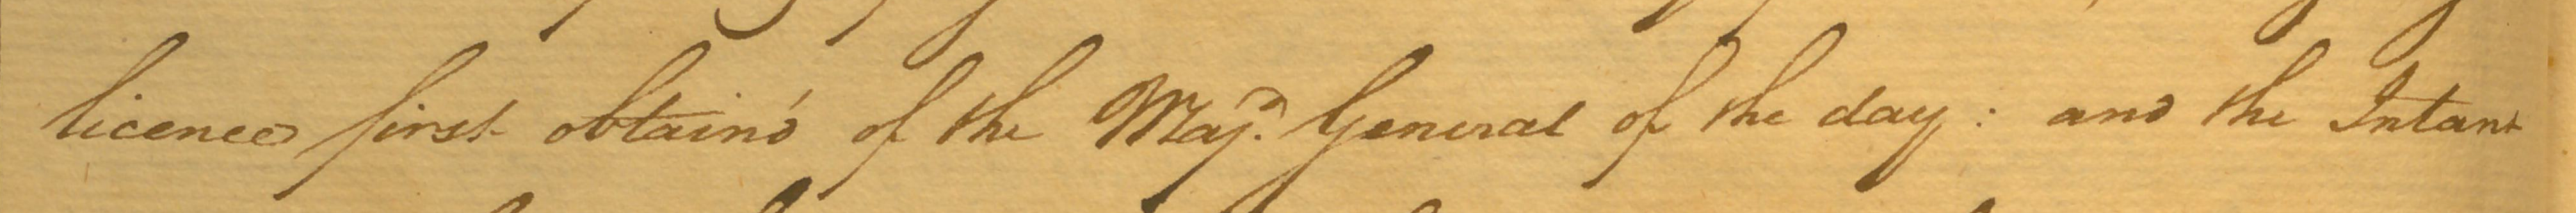license first obtain'd of the Maj^r. General of the day: and the Instant
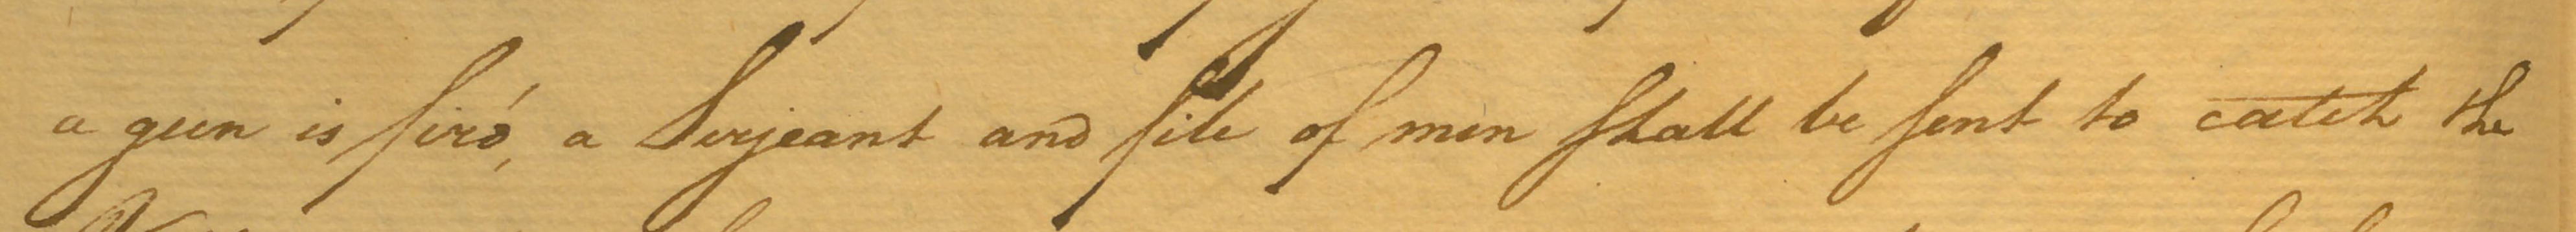a gun is fir'd, a Serjeant and file of men shall be sent to catch the
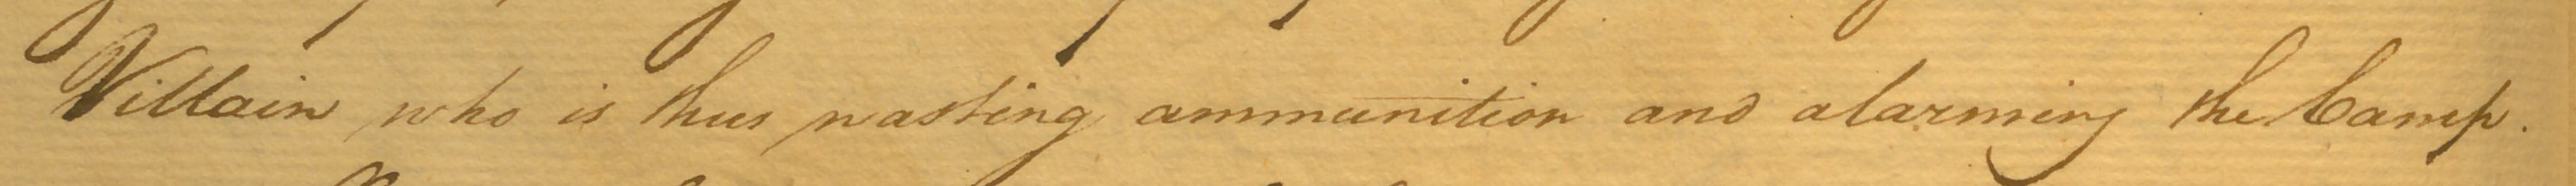Villain who is thus wasting ammunition and alarming the Camp.
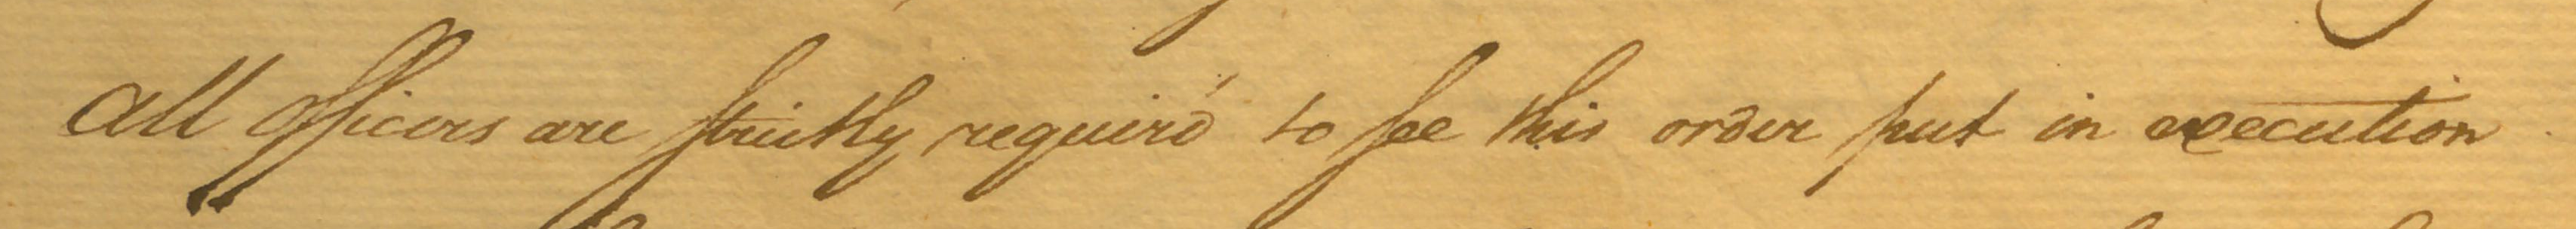All officers are strictly requir'd to see this order put in execution
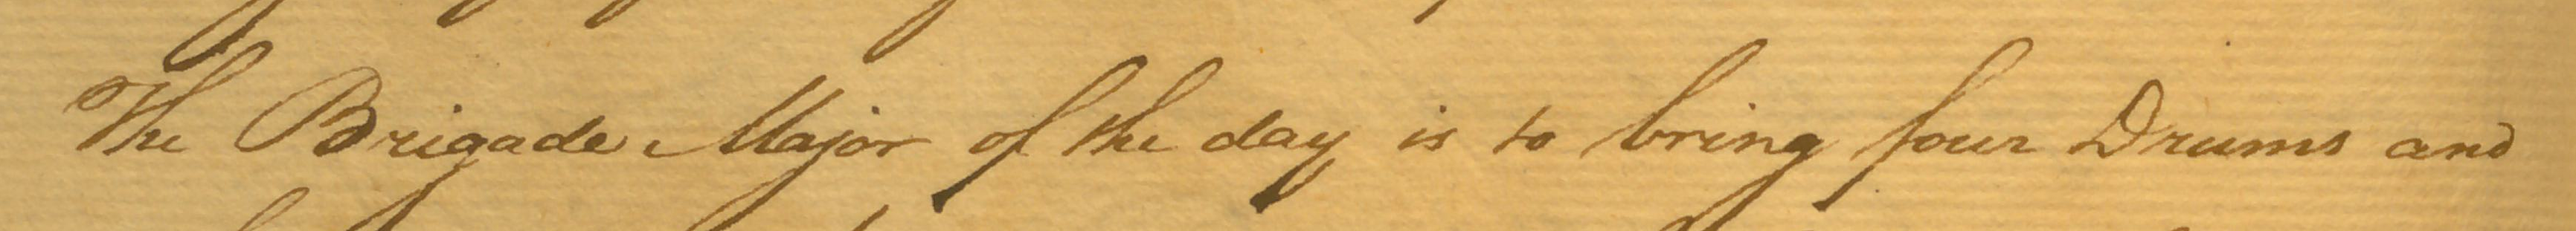The Brigade Major of the day is to bring four Drums and
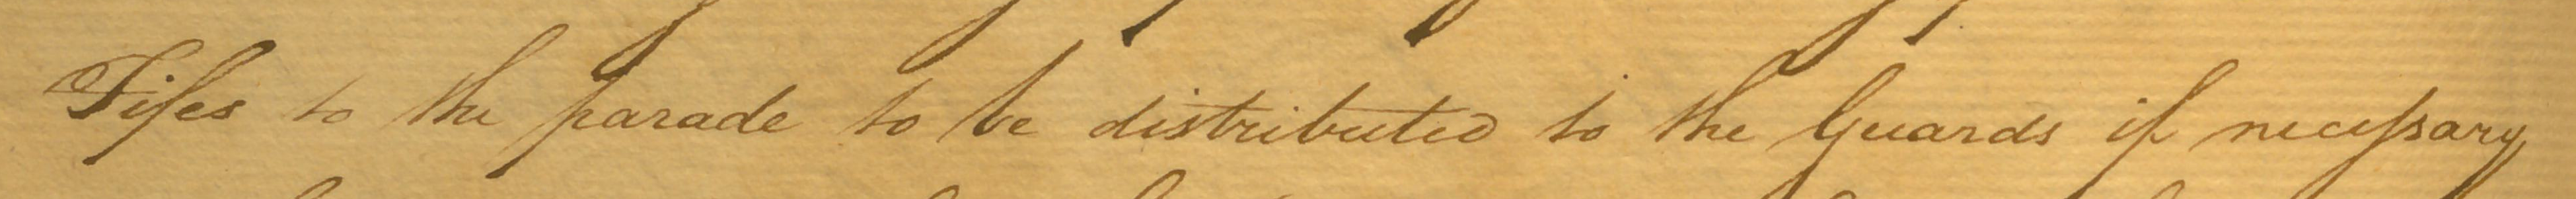Fifes to the parade to be distributed to the Guards if necessary
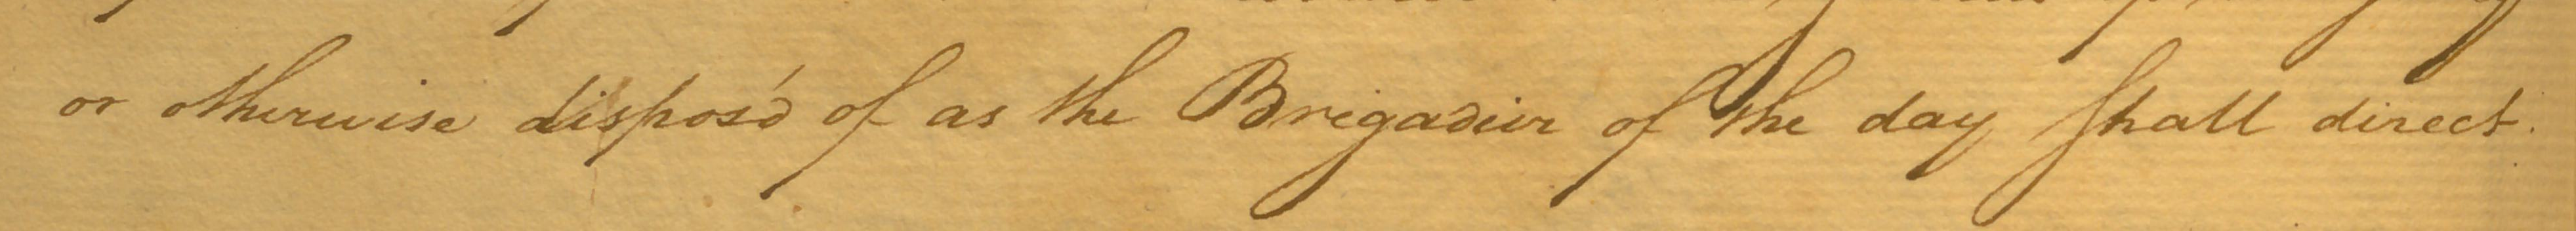or otherwise dispos'd of as the Brigadier of the day shall direct.
